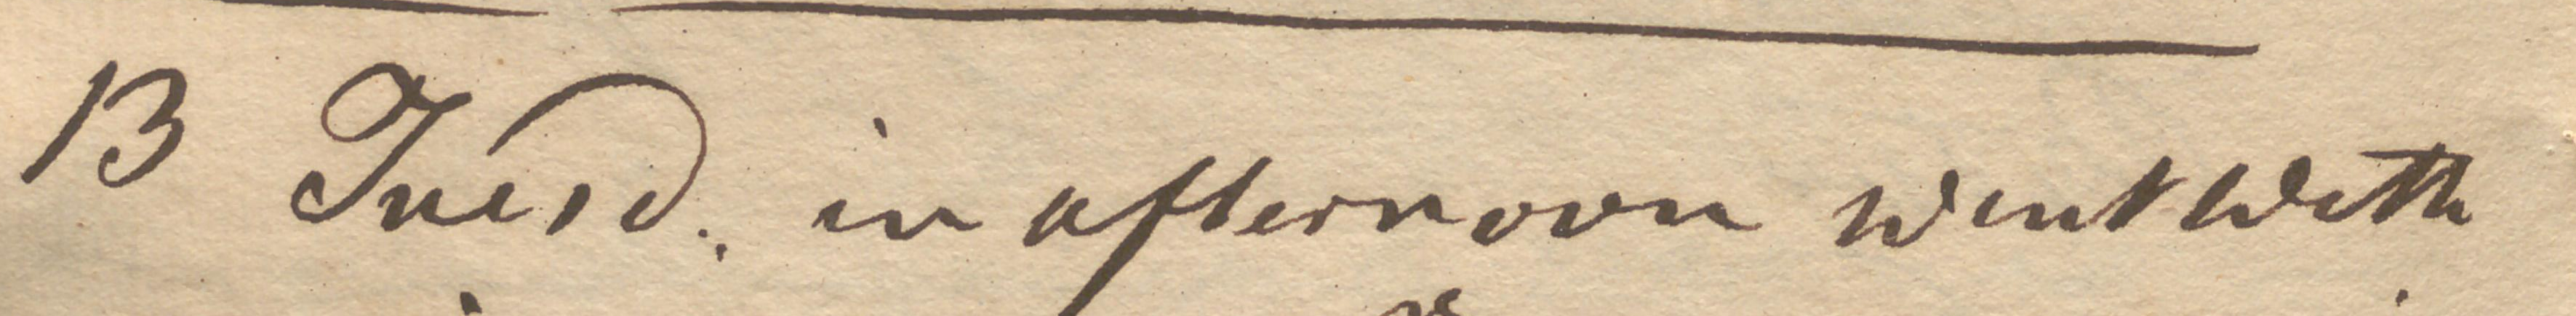13 Treed. in afternoon went with
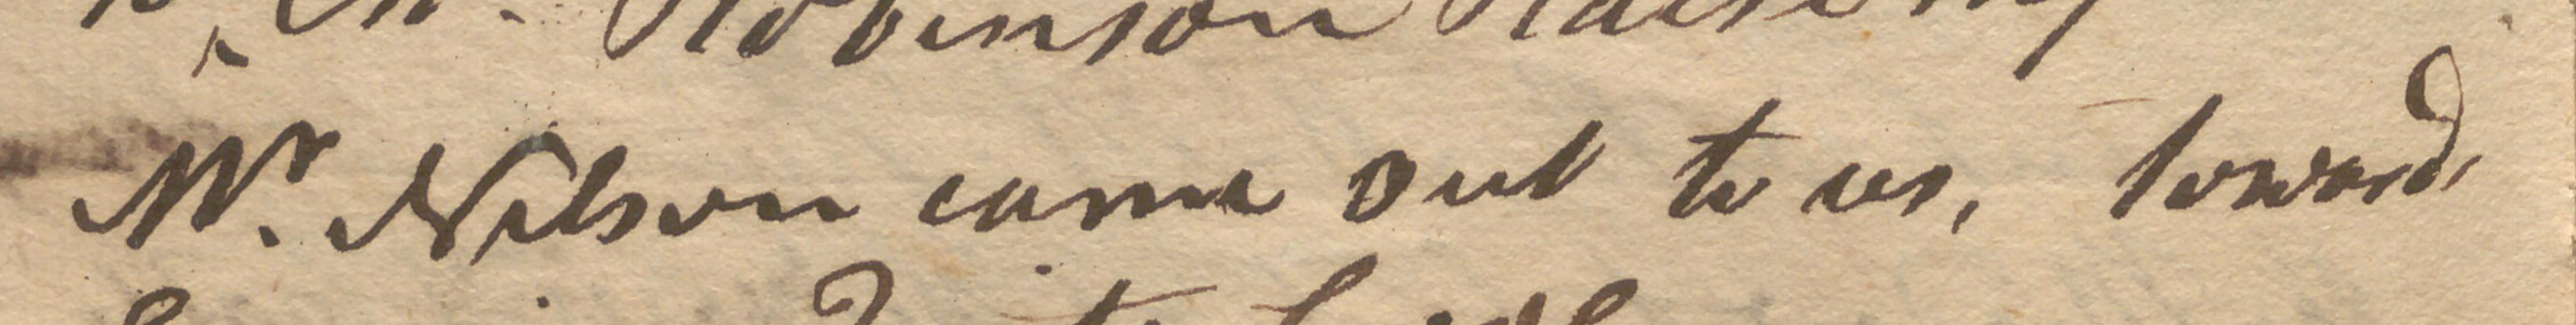M^r. Nelson came out to us, towards
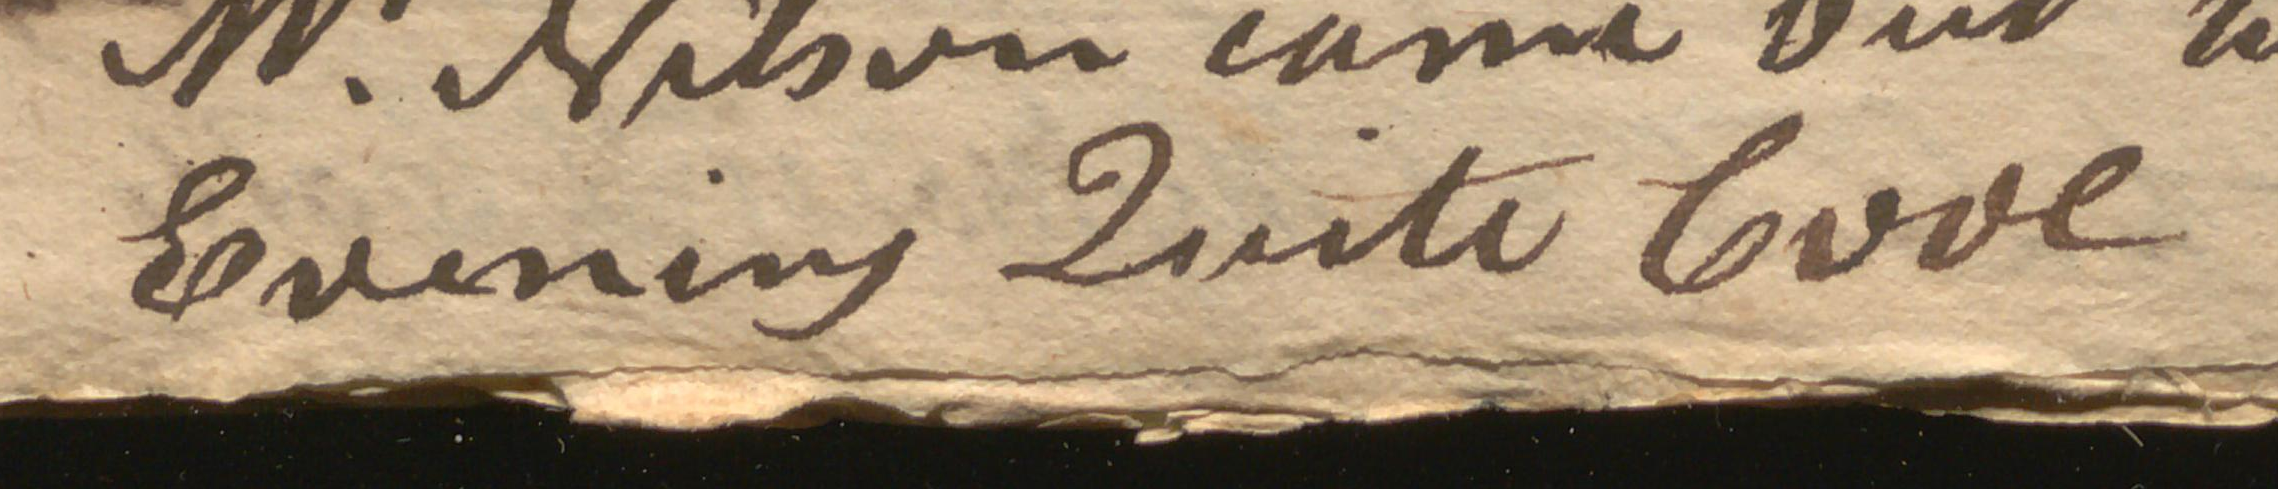Evening Quite Cool
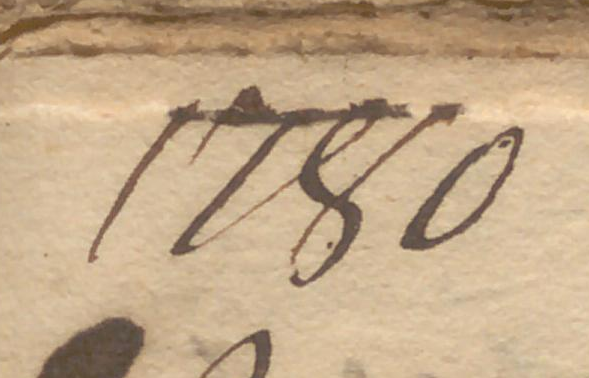1780
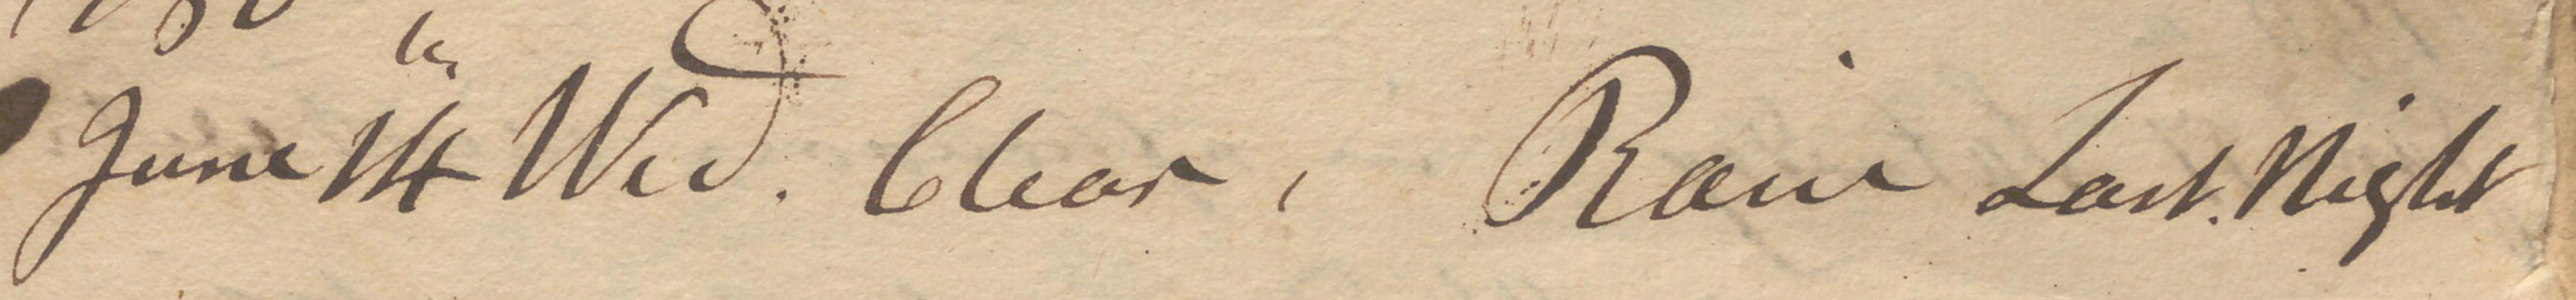June 14^th Wed. Clear. Rain Last Night
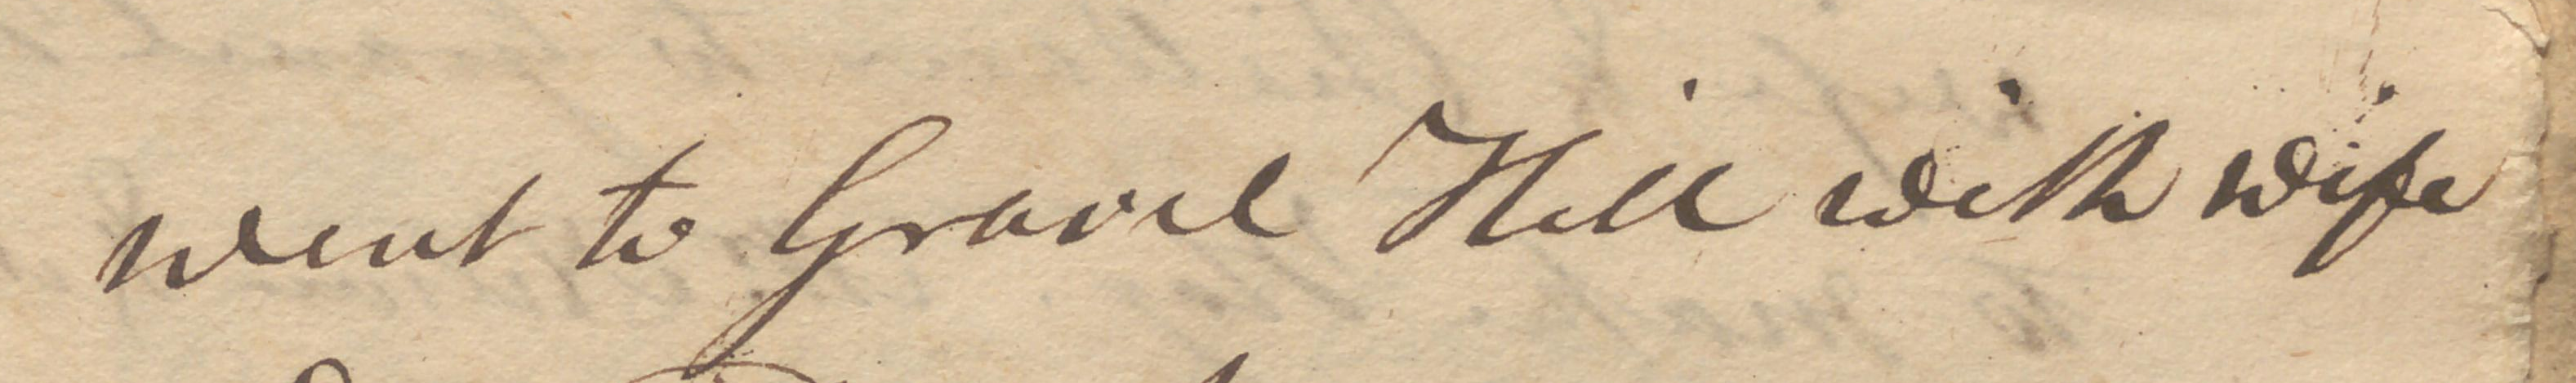went to Gravel Hill with wife
